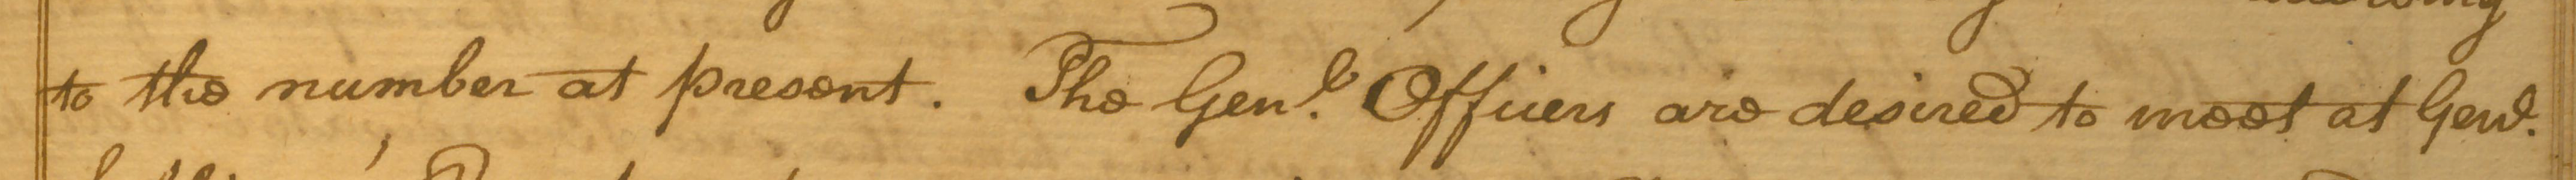to the number at present. The Gen^l. Officers are desired to meet at Gen^l.
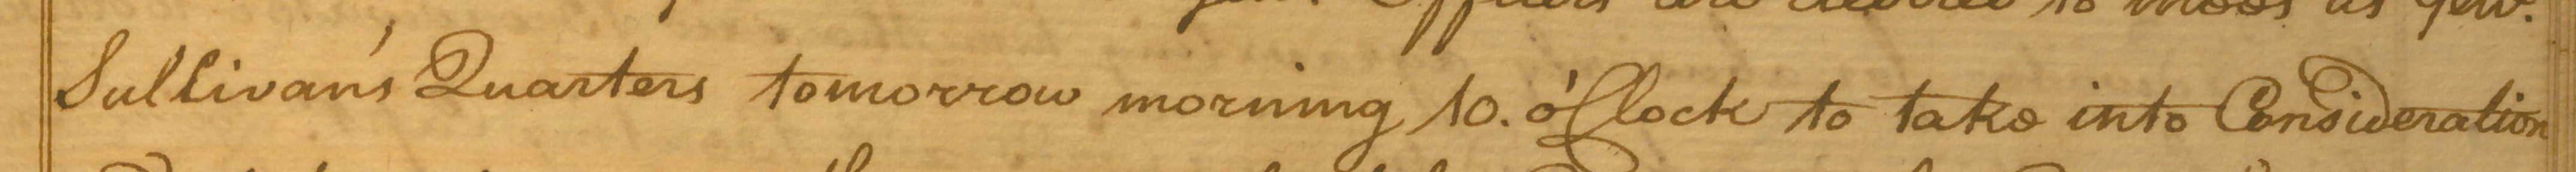Sullivan's Quarters tomorrow morning 10 o'Clock to take into Consideration
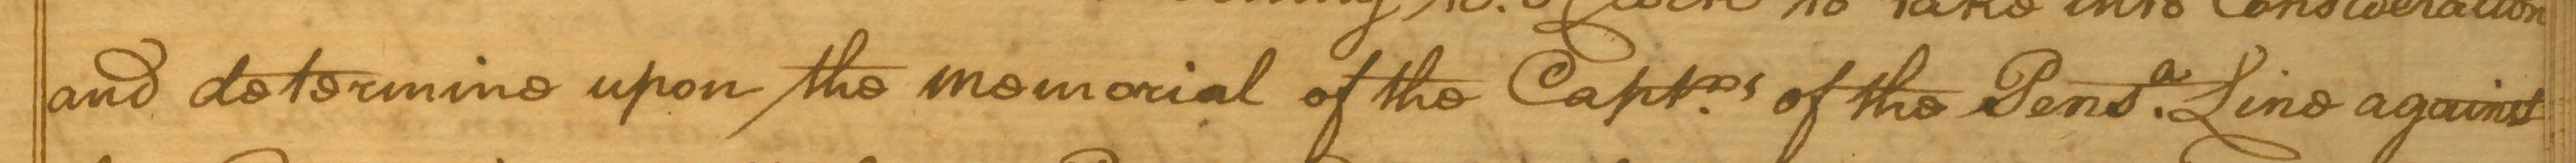and determine upon the memorial of the Capt^ns. of the Pens^a. Line against
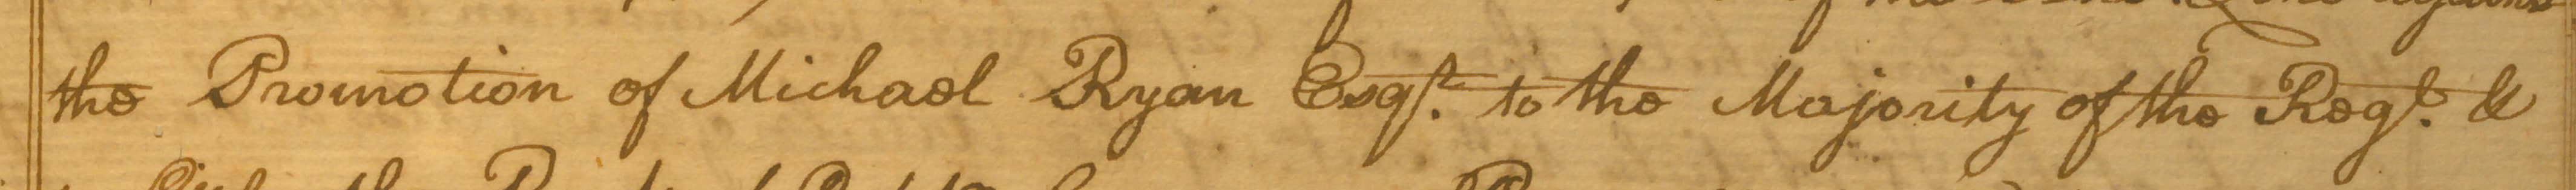the Promotion of Michael Ryan Esq^r. to the Majority of the Reg^t. &
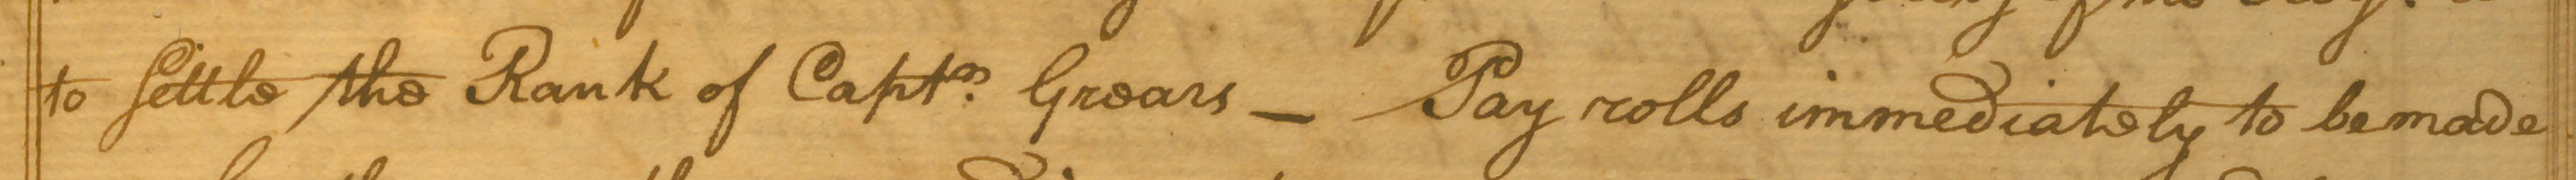to settle the Rank of Capt^n. Grears- Pay rolls immediately to be made
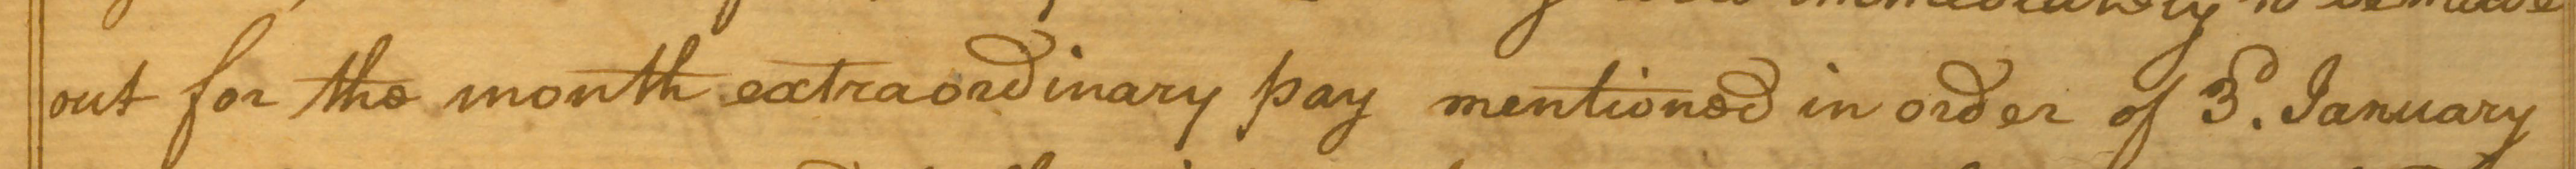out for the month extraordinary pay mentioned in order of 3^d. January
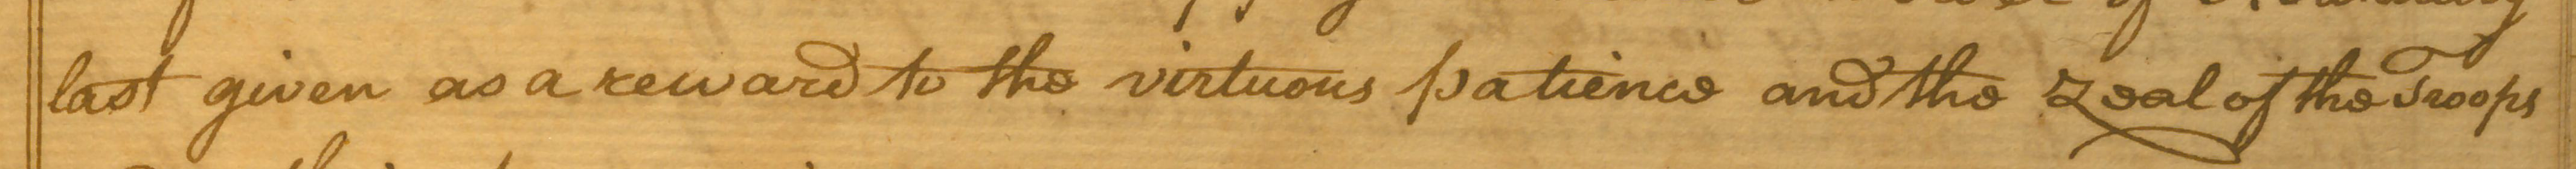last given as a reward to the virtuous patience and the zeal of the Troops
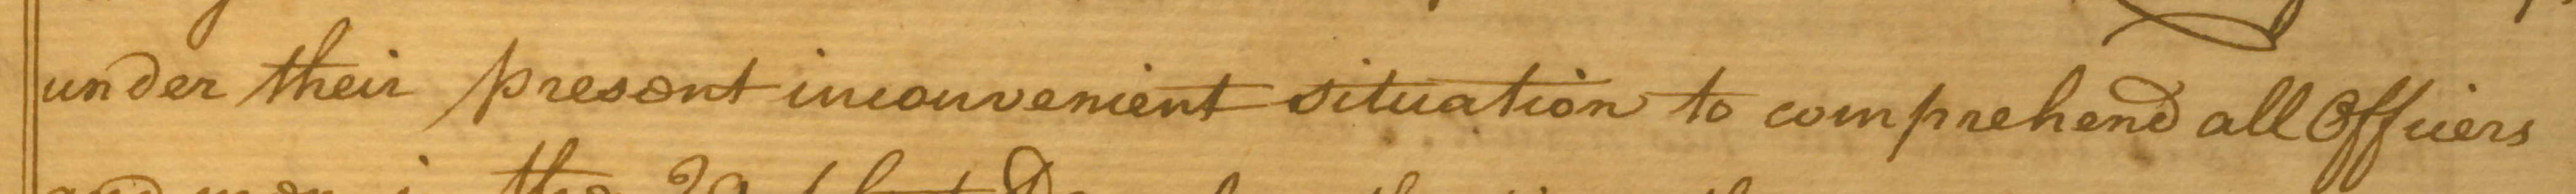under their present inconvenient situation to comprehend all Officers
